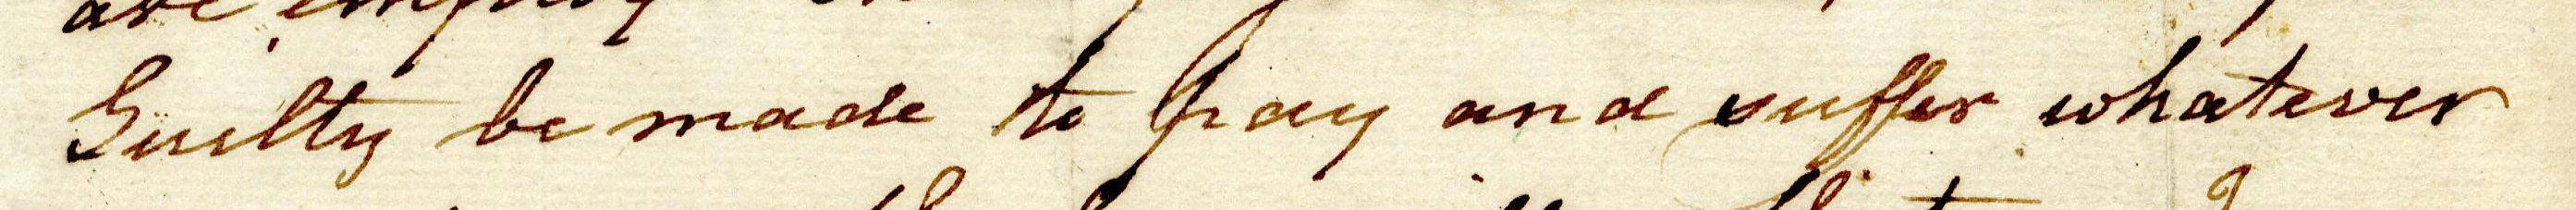Guilty be made to pay and suffer whatever
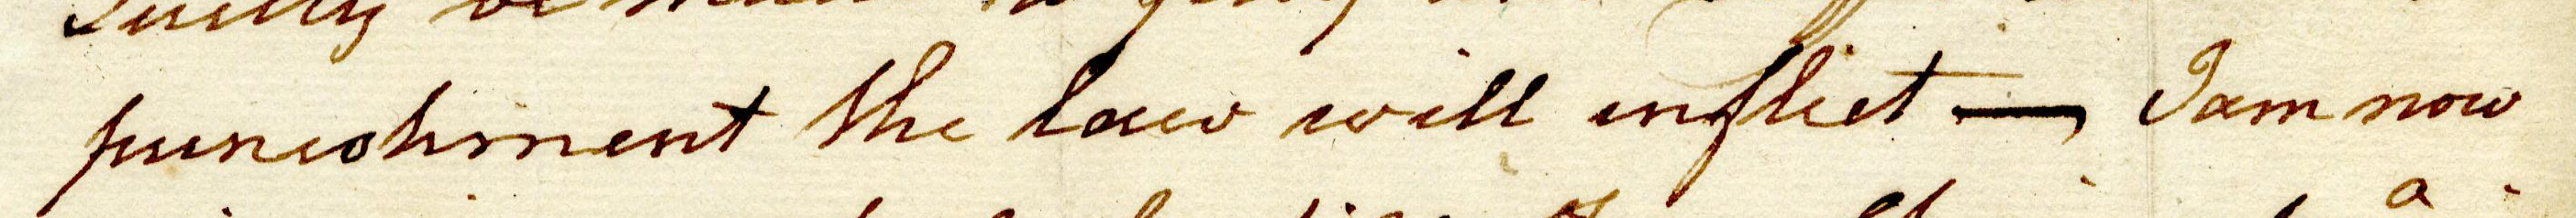punishment the law will inflict- I am now
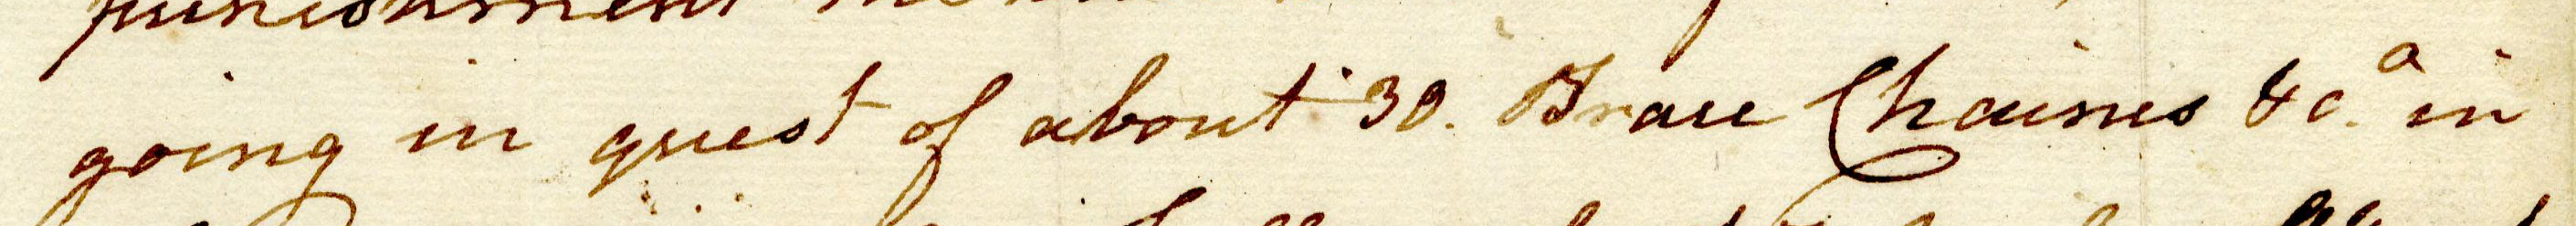going in quest of about 30 Brace Chains &c^a. in
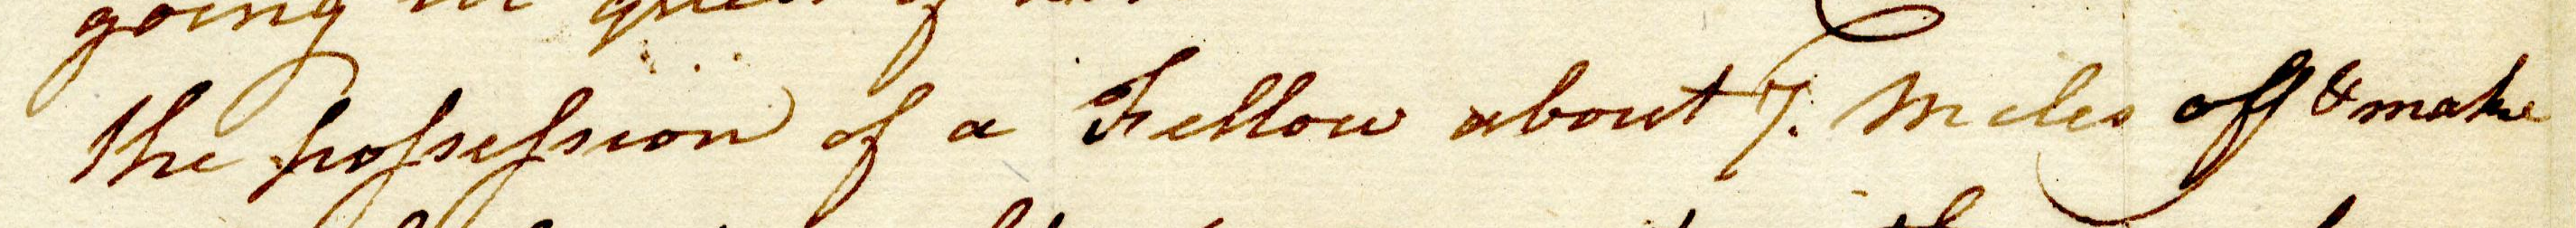the possession of a Fellow about 7. miles off & make
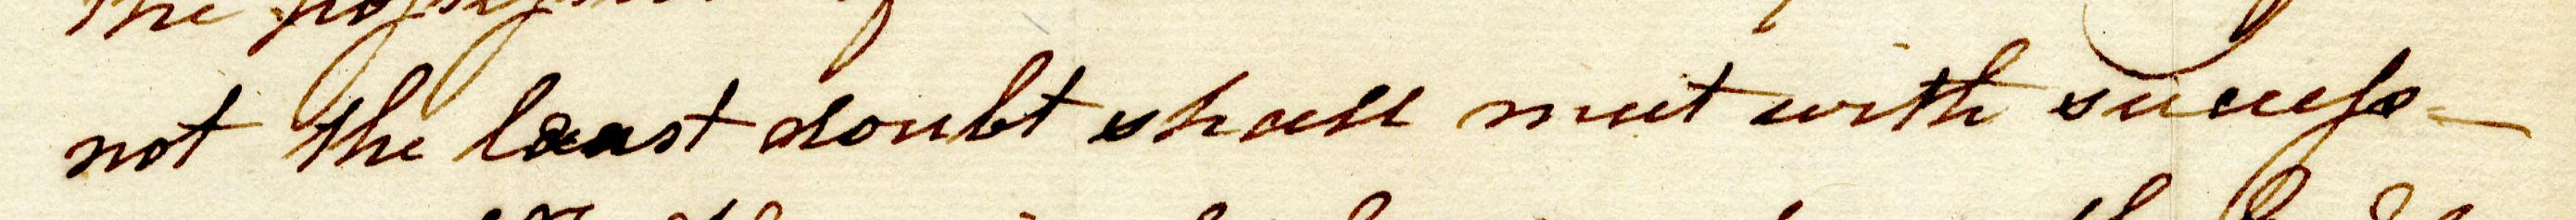not the least doubt shall meet with success-
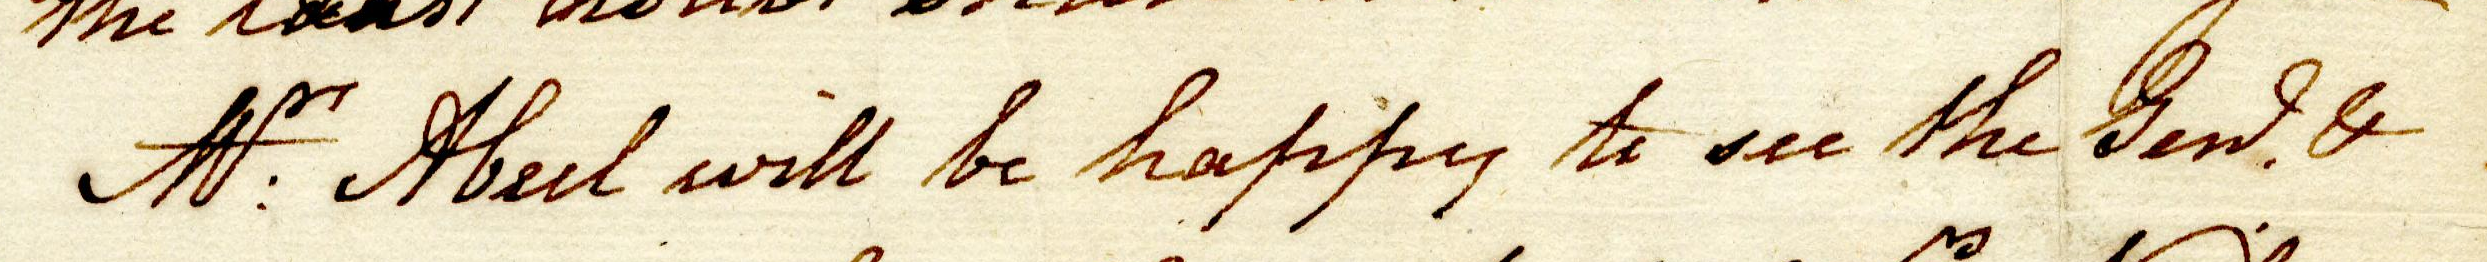M^rs. Abeel will be happy to see the Gen^l. &
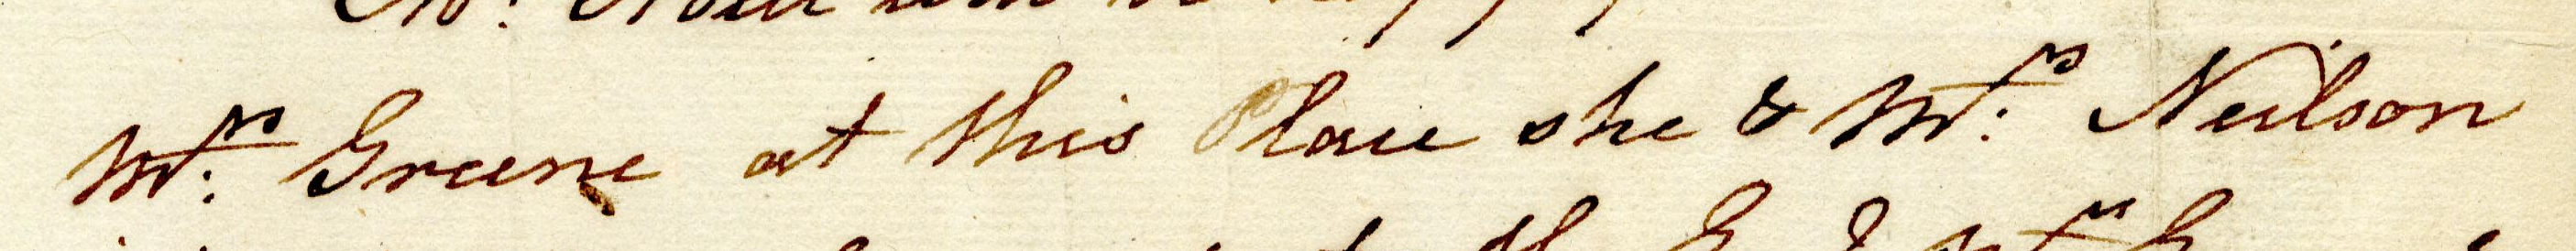M^rs: Greene at thsi Place she & M^rs: Neilson
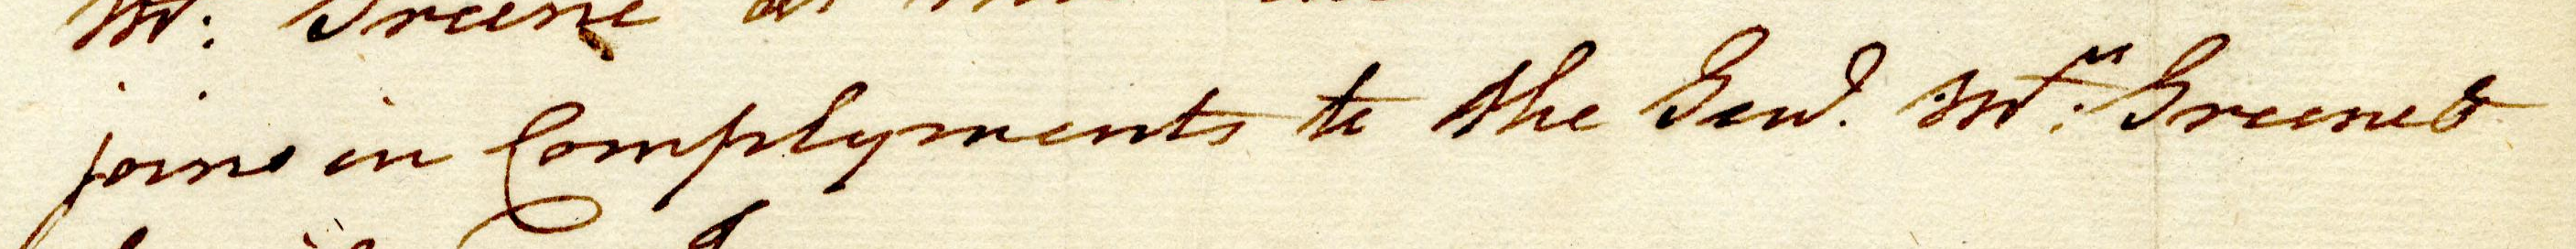joins in Complyments to the Gen^l. M^r. Greene &
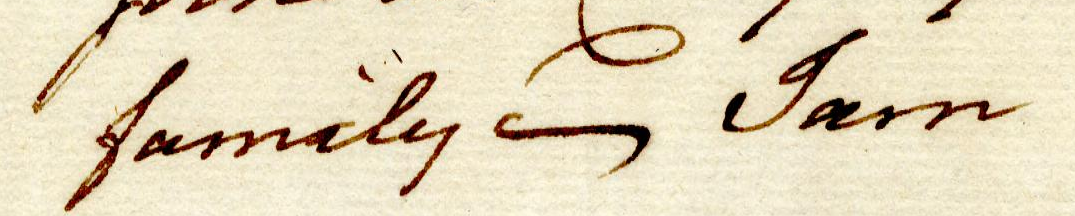family- I am
